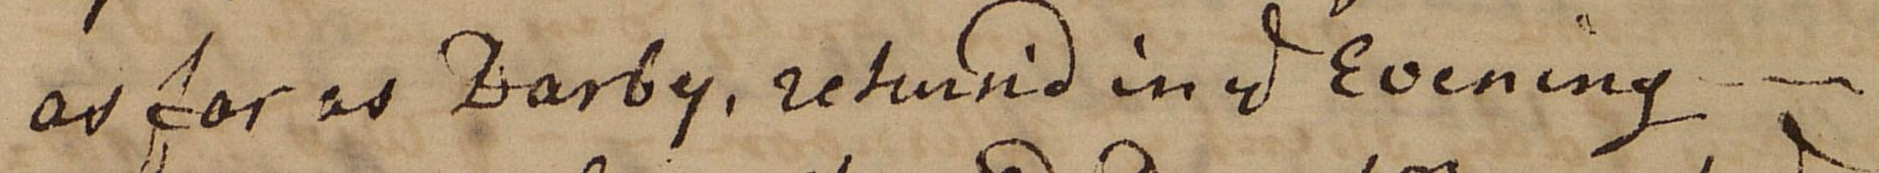as far as Darby, return'd in y^e Evening--
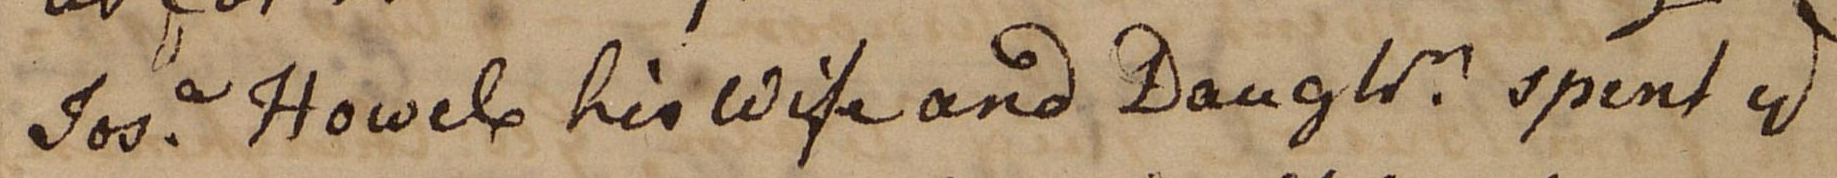Jos^a. Howel his Wife and Daugh^r. spent y^e
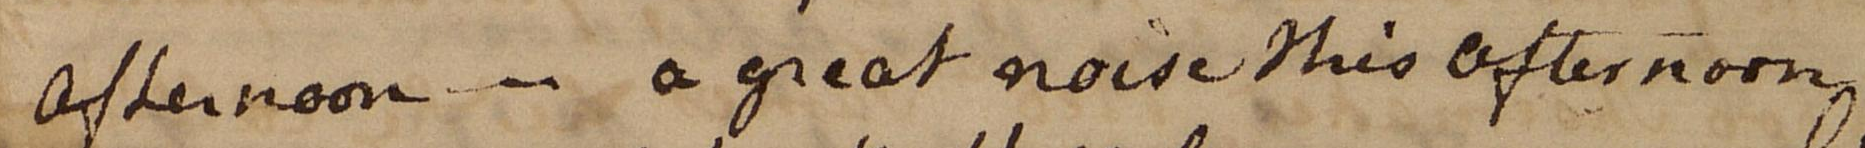Afternoon- a great noise this Afternoon,
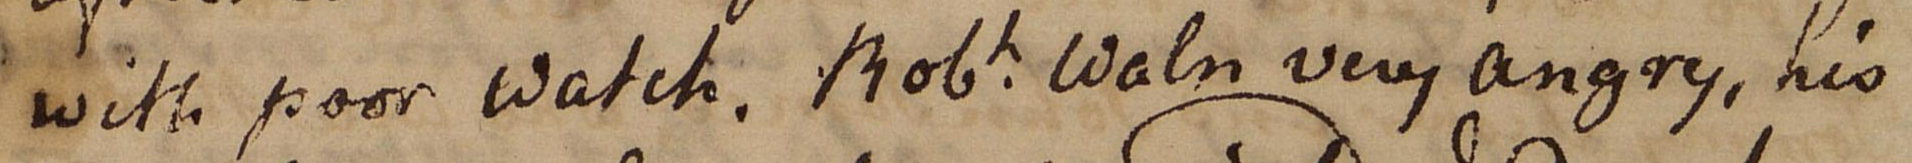with poor watch. Rob^t. Waln very angry, his
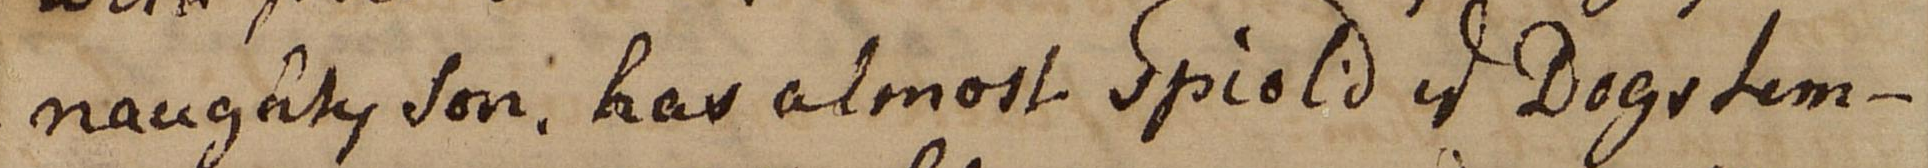naughty Son. has almost spiol'd y^e Dogs tem-
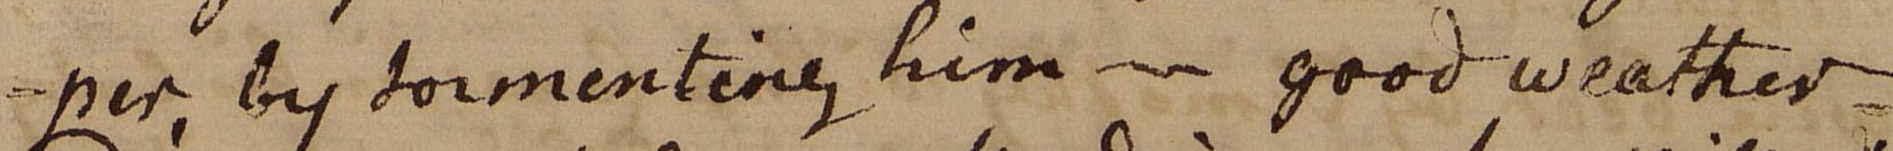-per, by tormenting him- good weather
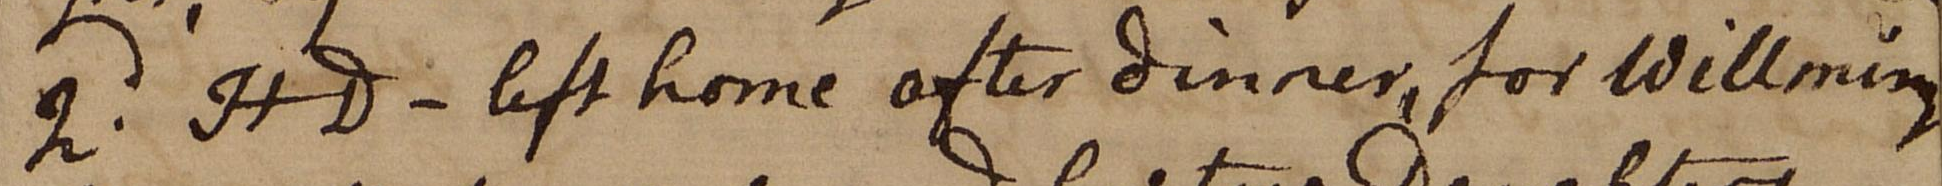2^d. HD- left home after dinner, for Willming
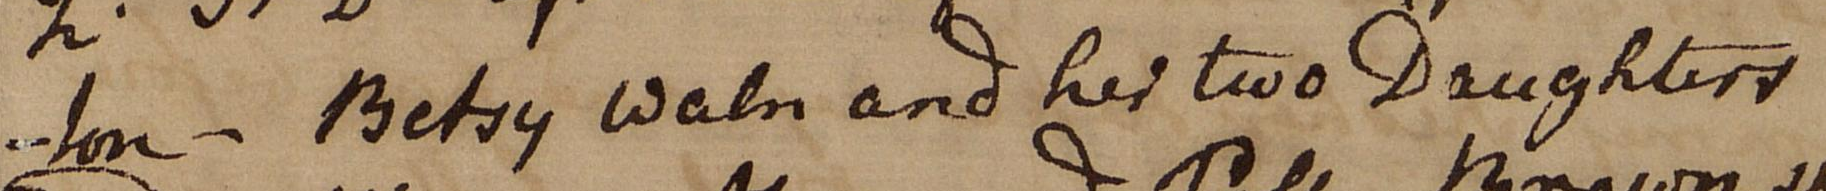-ton- Betsy Waln and her two Daughters
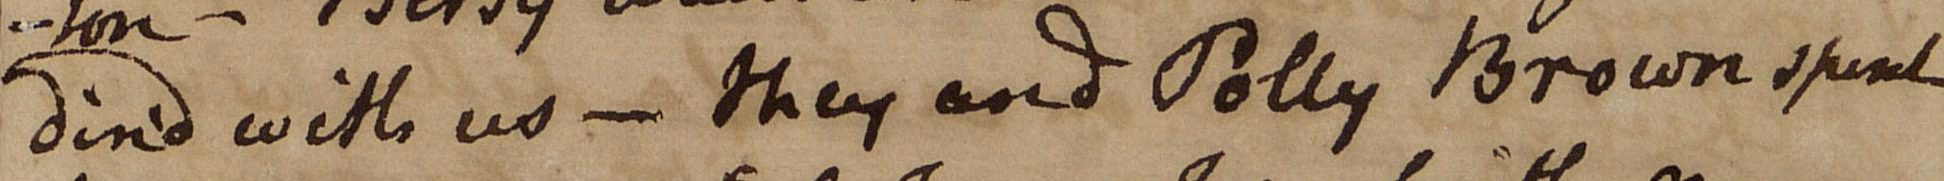din'd with us- they and Polly Brown spent
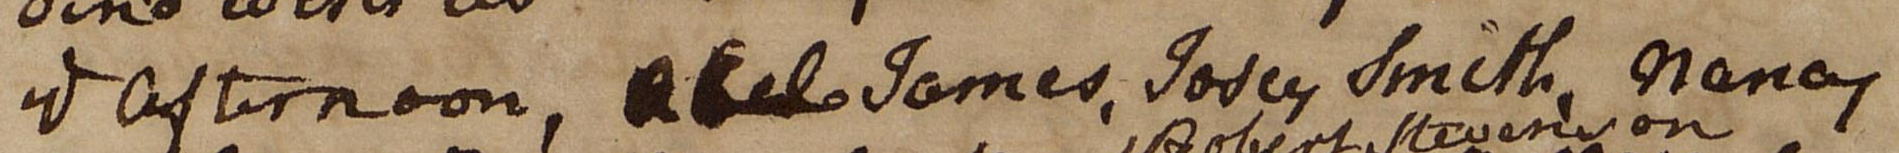y^e afternoon, Abel James, Josey Smith, Nancy
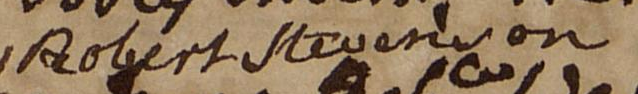Robert Stevenson
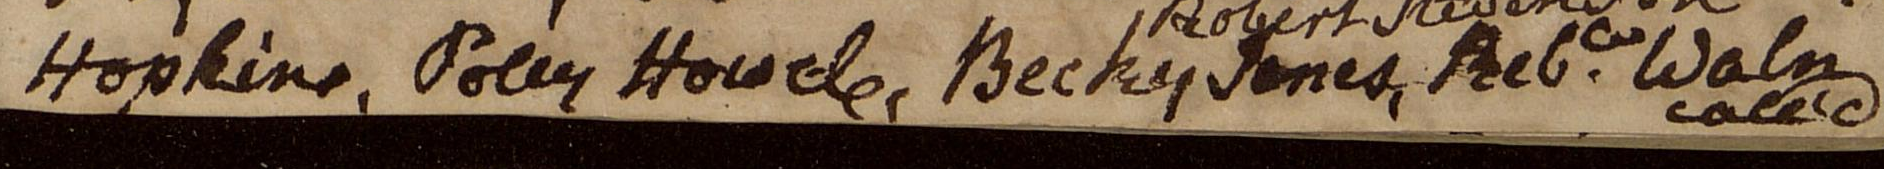Hopkins, Polly Howel, Becky Jones, Reb^a. Waln
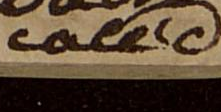call'd
